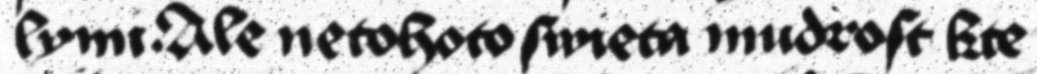lymi. Ale netohoto ſwieta mudroſt kte
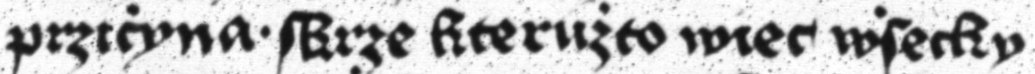prziċyna. ſkrze kterúžto wiec wẛecky
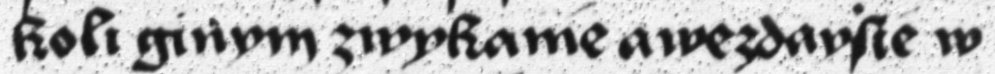koli ginym zwykaníe a wezdayẛíe w
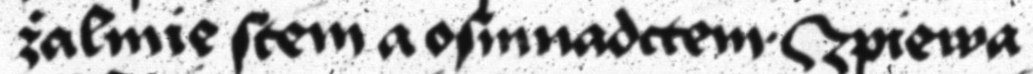żalmie ſtem a oſmnadctem Zpiewa
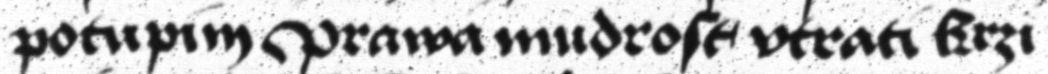potupím Prawá mudroſt vtratí krzi
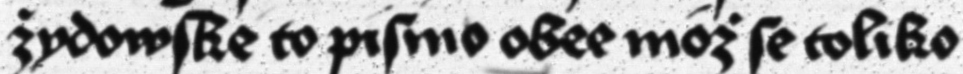žydowſké to píſmo obee móž ſe toliko
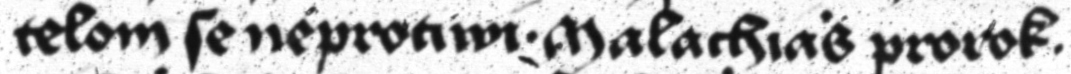telom ſe neprotiwí. Malachiaṡ prorok.
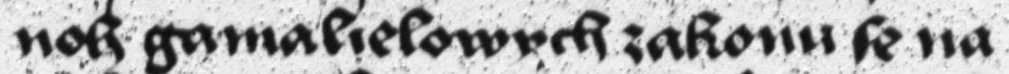noh gamalielowych zákonu se na
